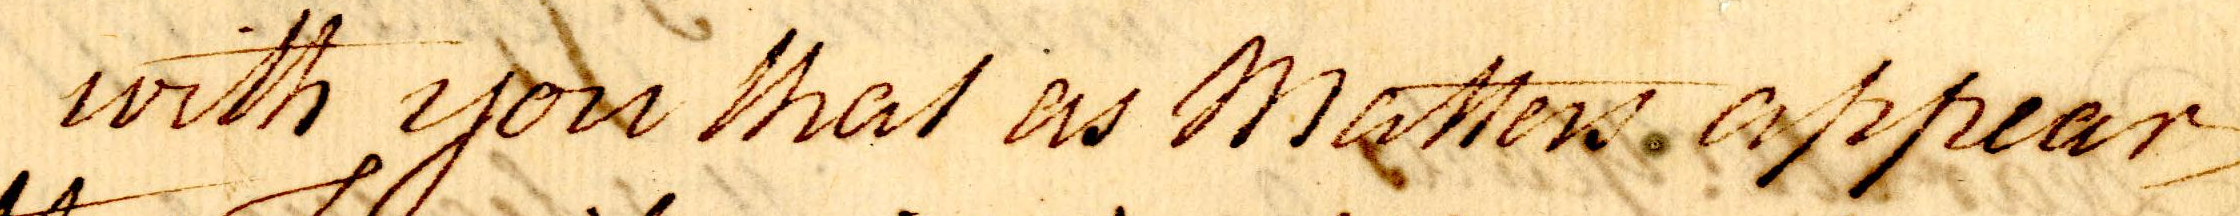with you that as Matters appear
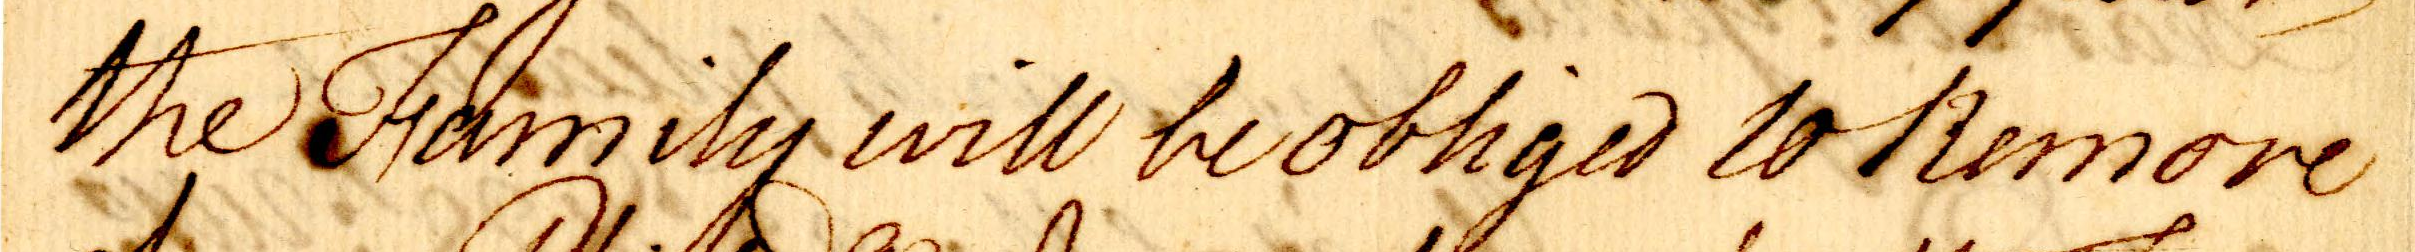the Family will be obliged to Remove
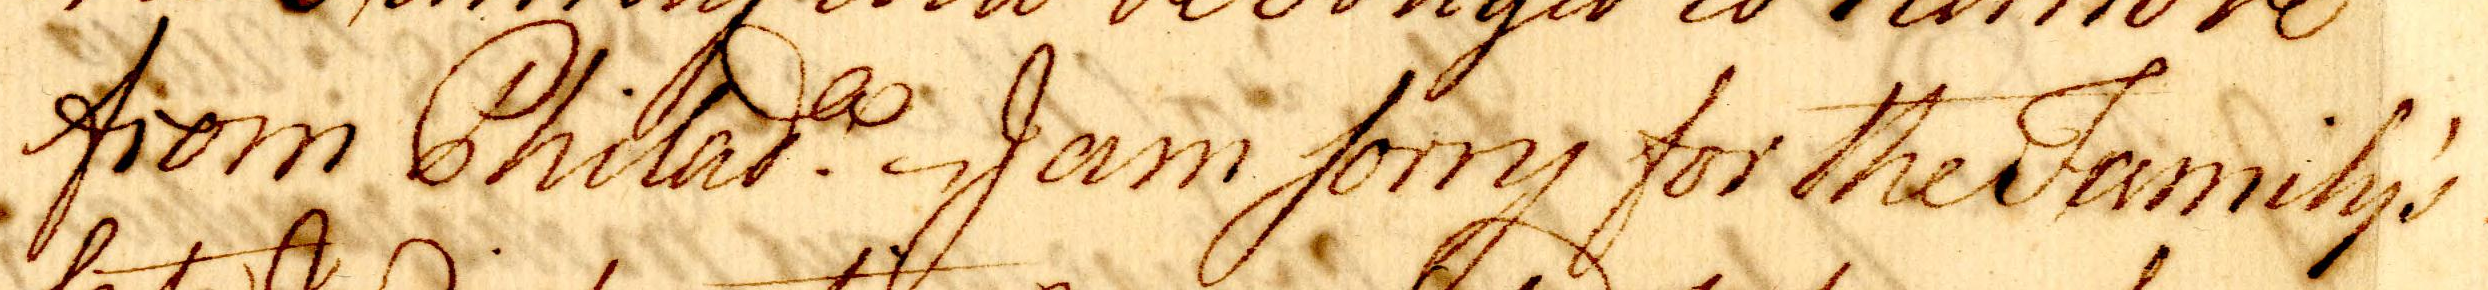from Philad^a. I am sorry for the Family's
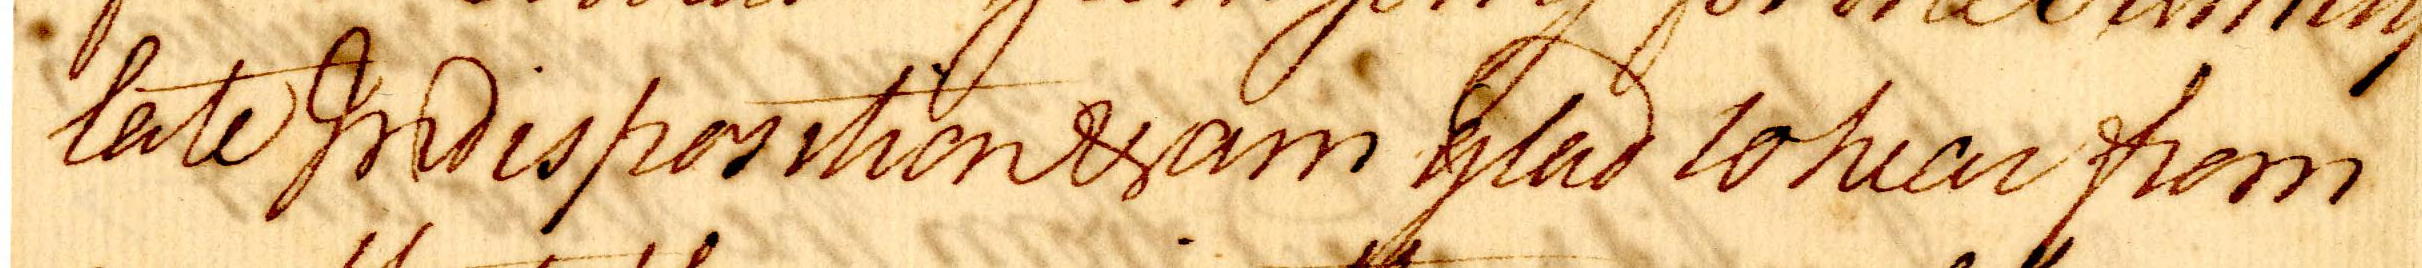late Indisposition & am glad to hear from
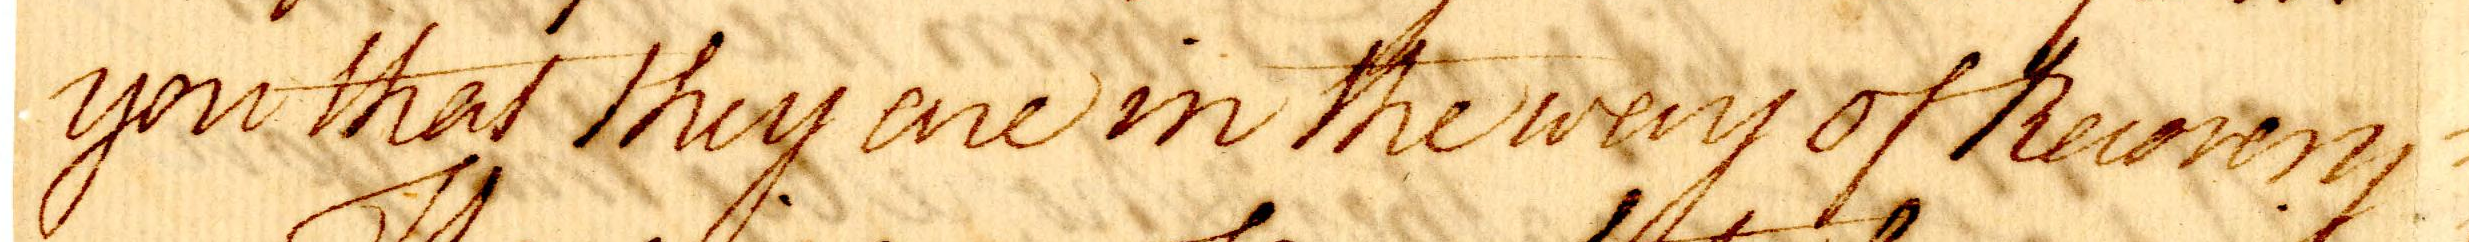you that they are in the way of Recovery.
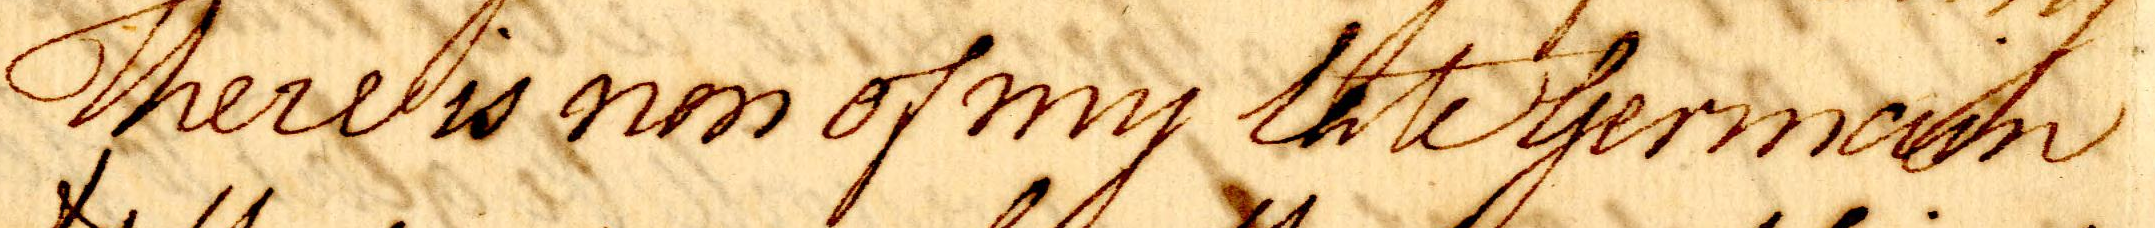There is non of my late German
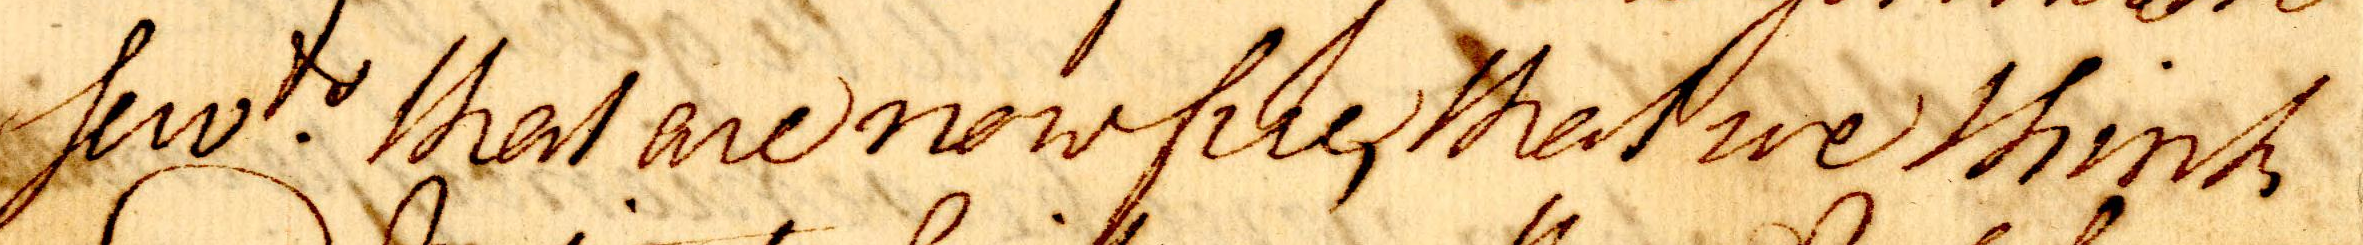Serv^ts. that are now free, that we think
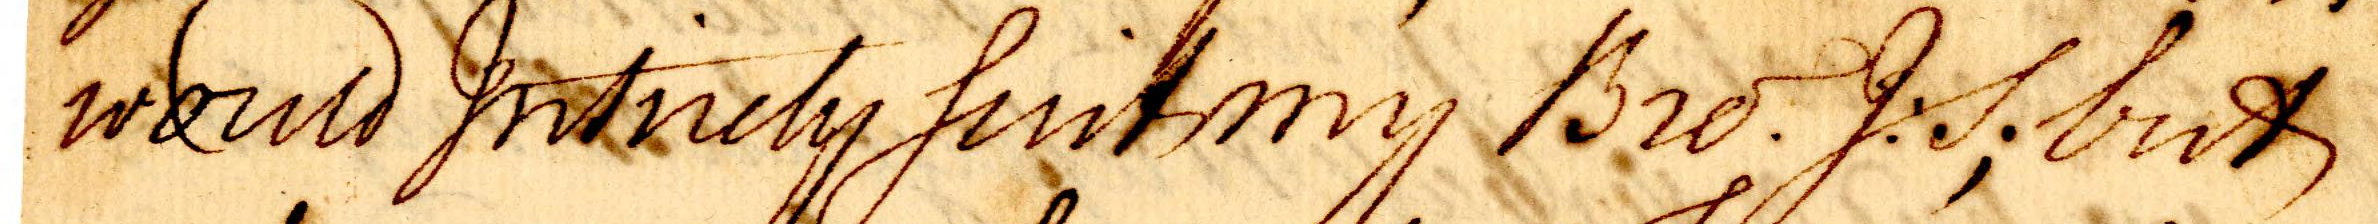would Intirely suit my Bro. J. S; but
